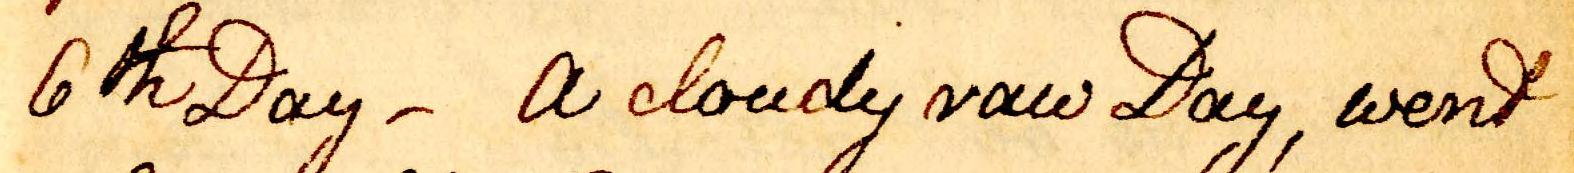6^th Day- A cloudy raw Day, went
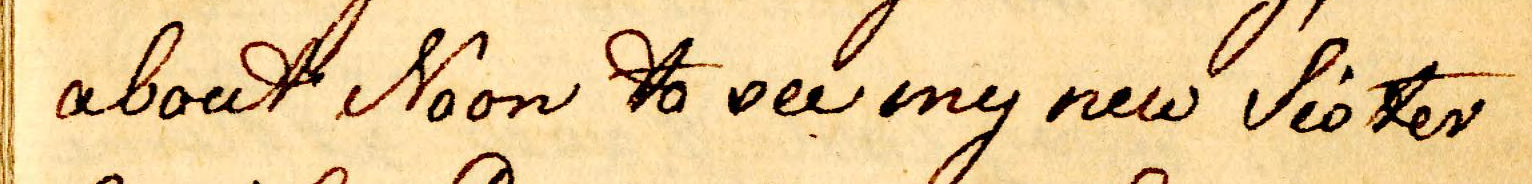about Noon to see my new Sister
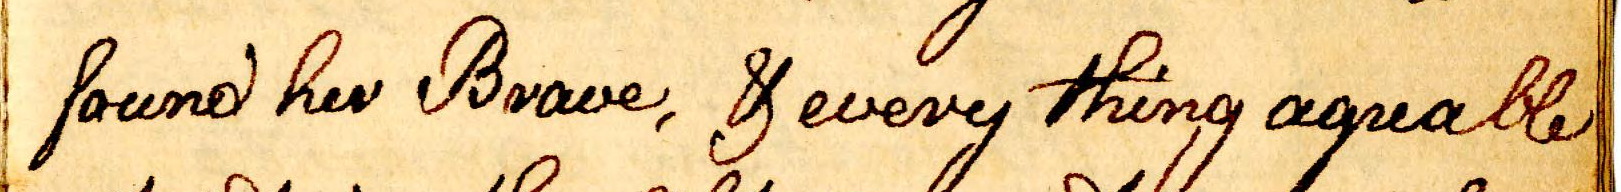found her Brave, & every thing agreable
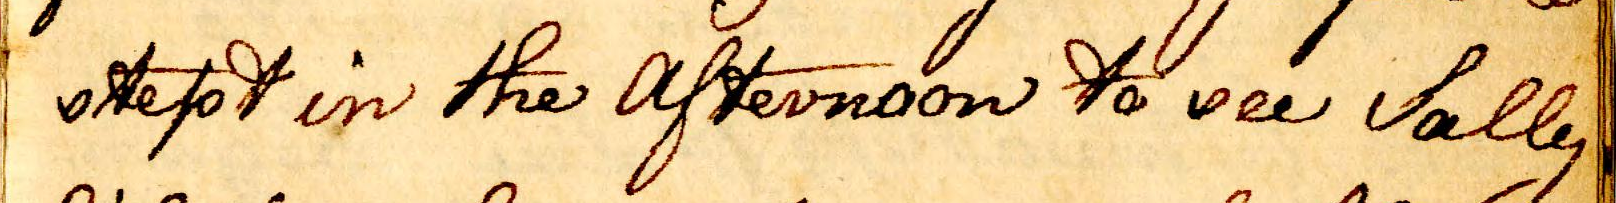stept in the Afternoon to see Sally
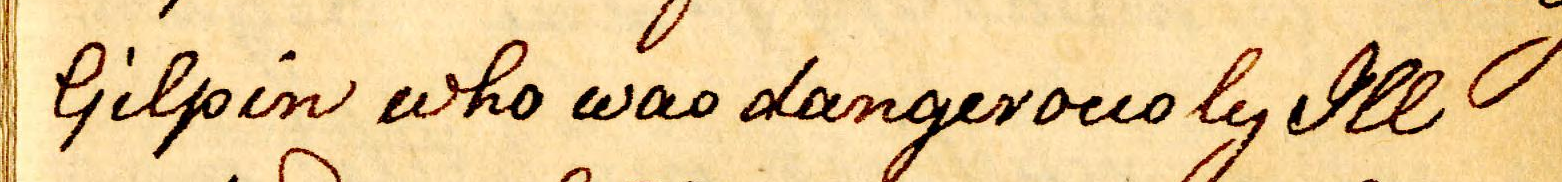Gilpin who was dangerously Ill
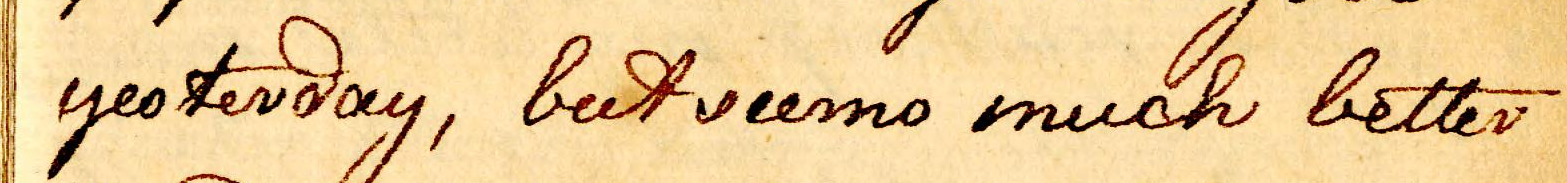yesterday, but seems much better
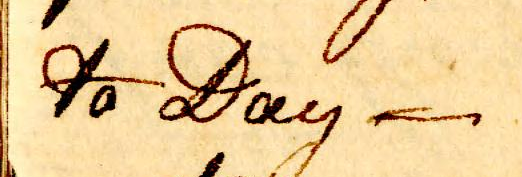to Day-
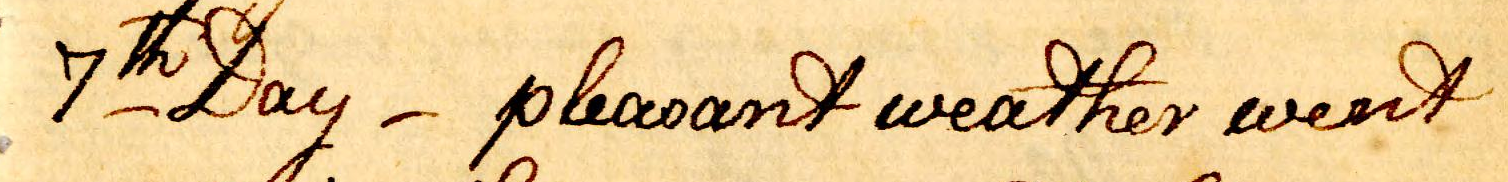7^th Day- pleasant weather went
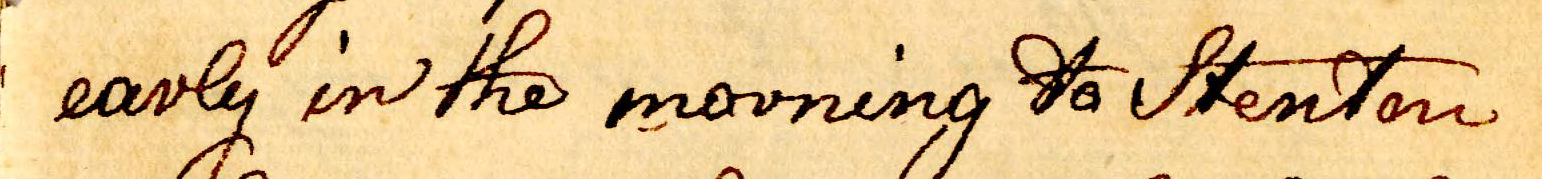early in the morning to Stenton
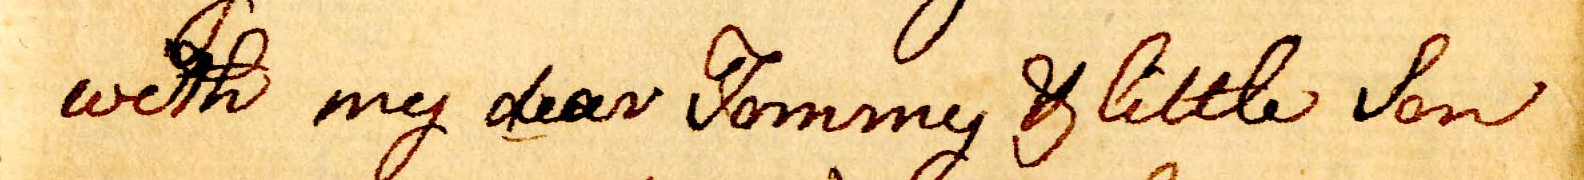with my dear Tommy & little Son
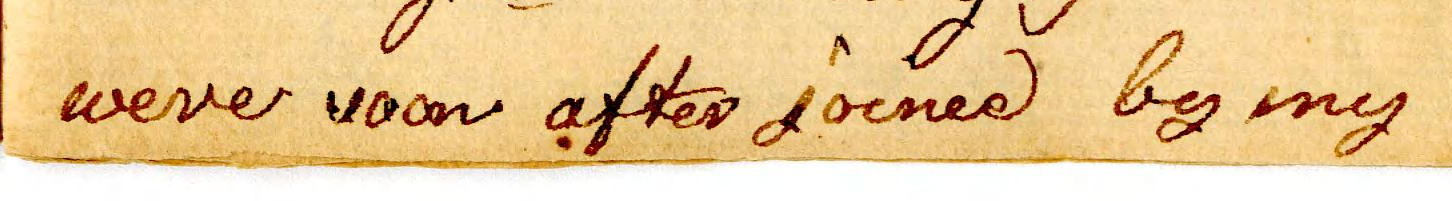were soon after joined by my
